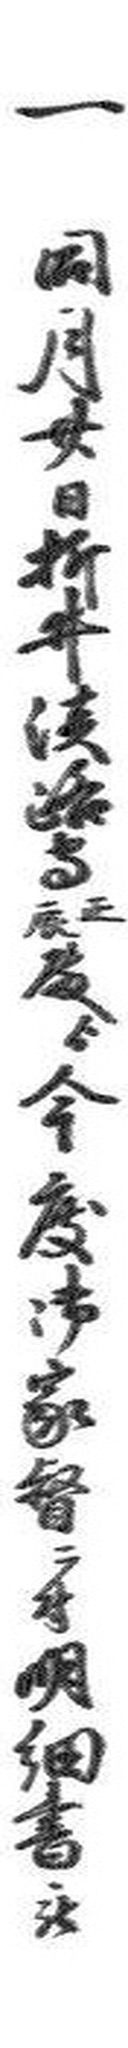一同月廿日折井淡路守正辰殿ゟ今度御家督ニ付明細書被
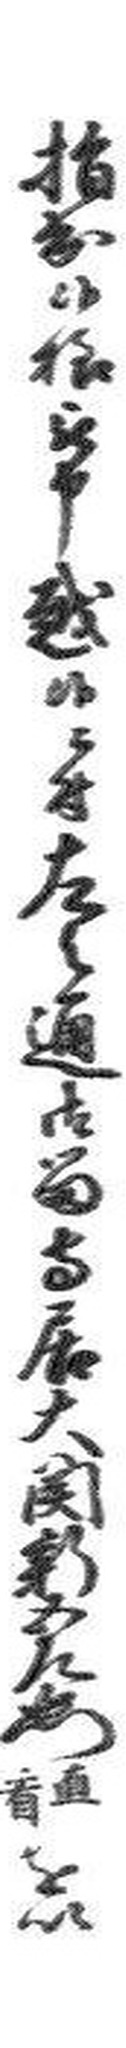指出候様被申越候ニ付左之通御留守居大関新五左衛門直看を以
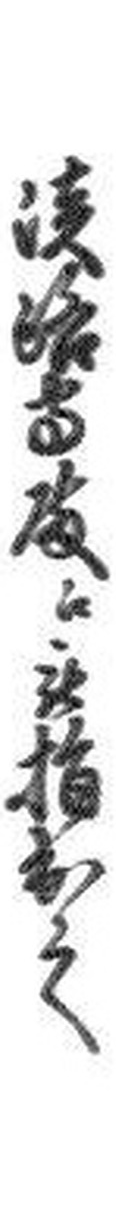淡路守殿江被指出之

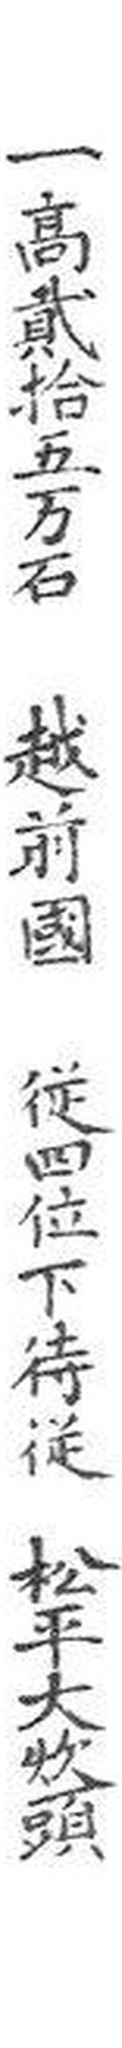一高弐拾五万石越前国従四位下侍従松平大炊頭
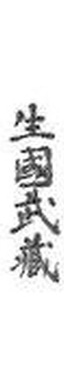生国武蔵
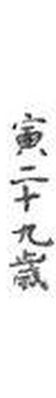寅二十九歳
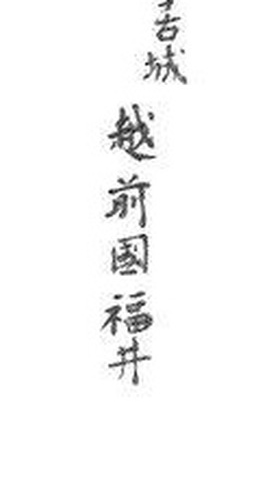越前国福井
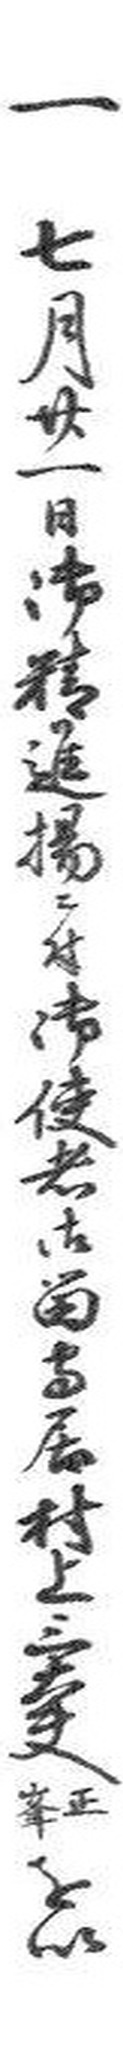一七月廿一日御精進揚ニ付御使者御留守居村上三太夫正峯を以
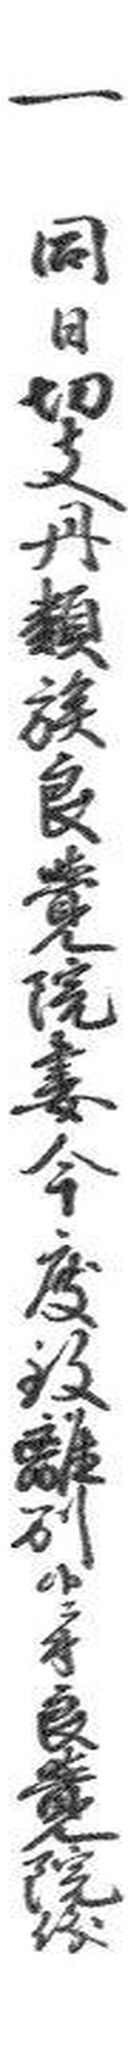一同日切支丹類族良覚院妻今度致離別候ニ付良覚院儀
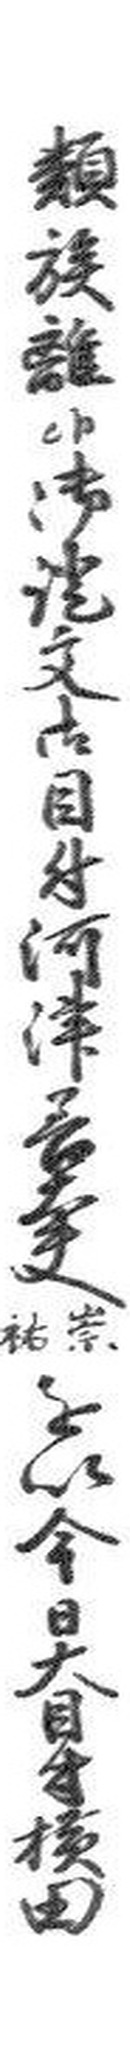類族離候御証文御目付河津善太夫崇祐を以今日大目付横田
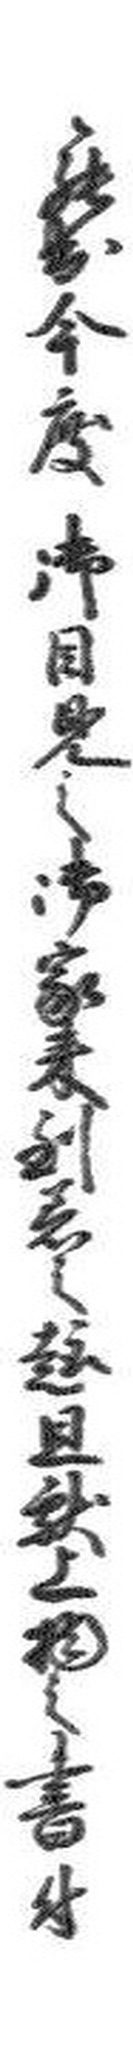罷出今度御目見之御家来到着之趣且献上物之書付
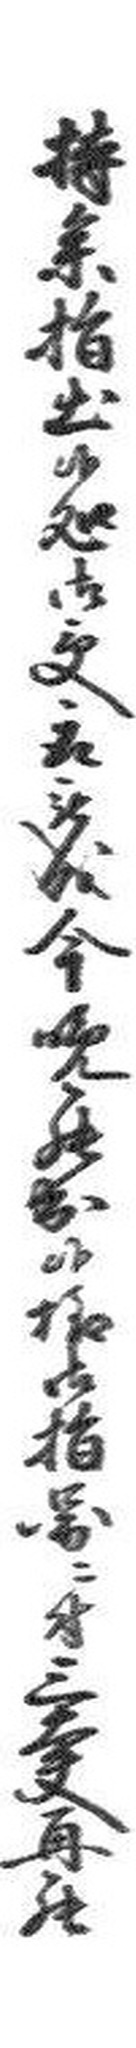持参指出候処御受取被成今晩罷出候様御指図ニ付三太夫再罷
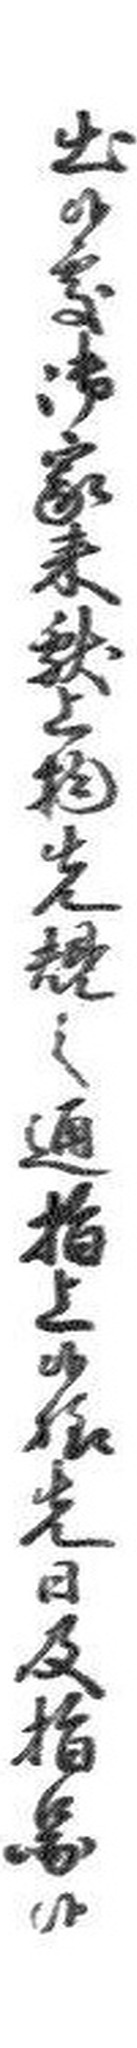出候処御家来献上物先規之通指上候様先日及指図候
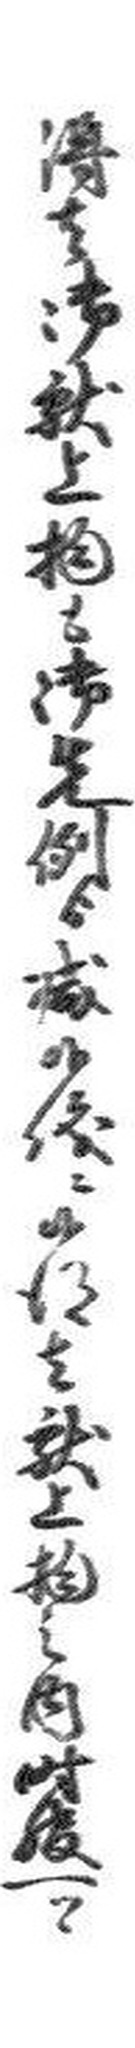得共御献上物も御先例ヨリ減候儀ニ候得者献上物之内時服一ツ
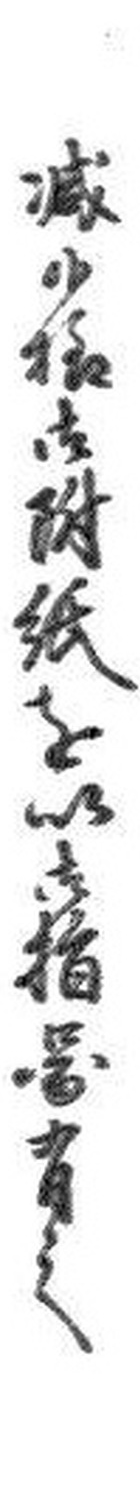減候様御附紙を以御指図有之
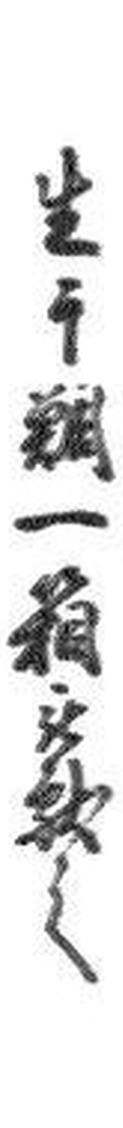生干鯛一箱被献之
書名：家譜 二十八 吉邦公 従宝永七年七月五日到正徳元年十二月
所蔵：福井県文書館 Fukui Prefectural Archives
